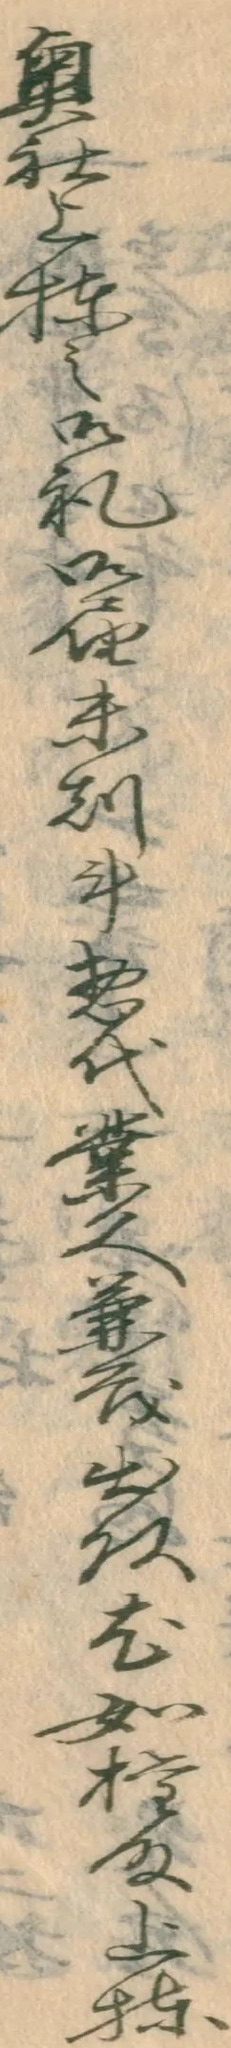一奥社上棟之御礼御届未刻計惣代業久兼茂出頭尤如権殿上棟
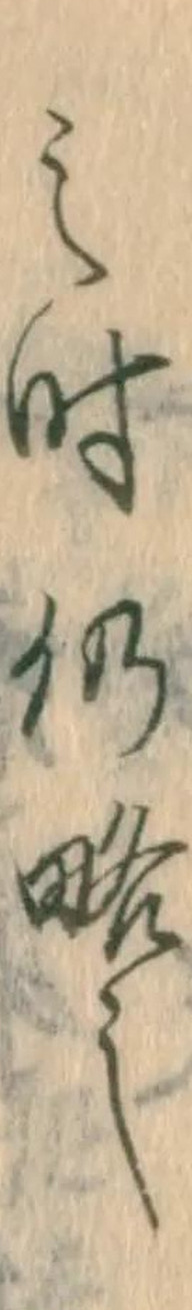之時仍略之
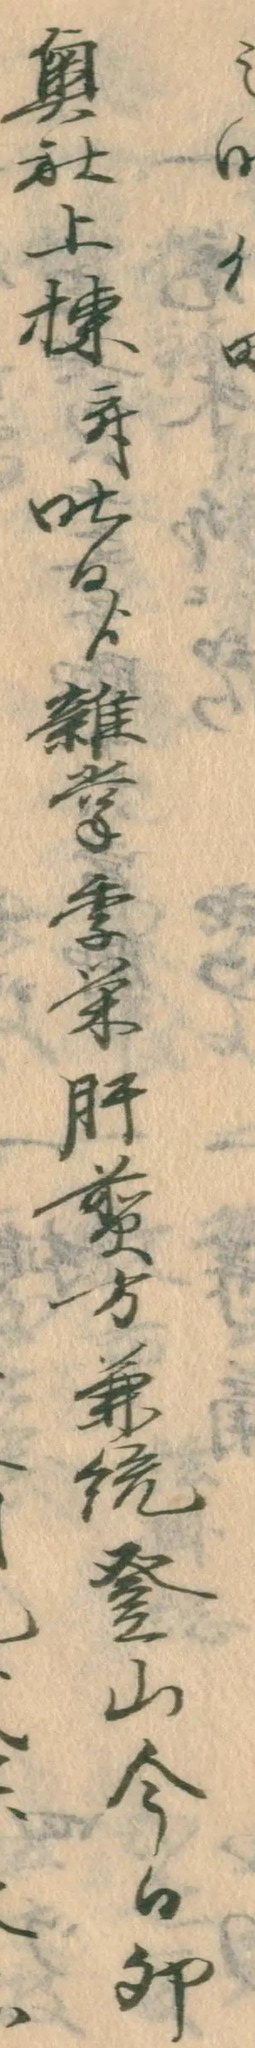一奥社上棟ニ付昨日ゟ雑掌季栄肝煎方兼統登山今日卯
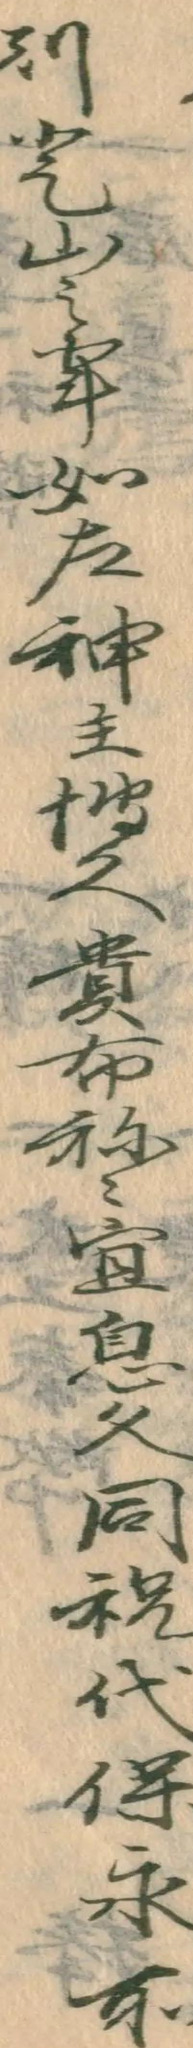刻登山之輩如左神主博久貴布祢々宜息久同祝代保永所
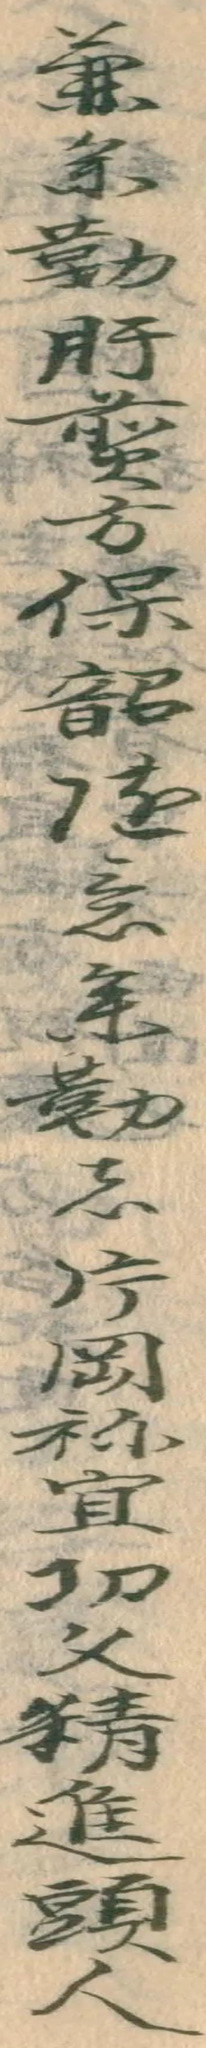兼参勤肝煎方保韶随意参勤は片岡祢宜功久精進頭人
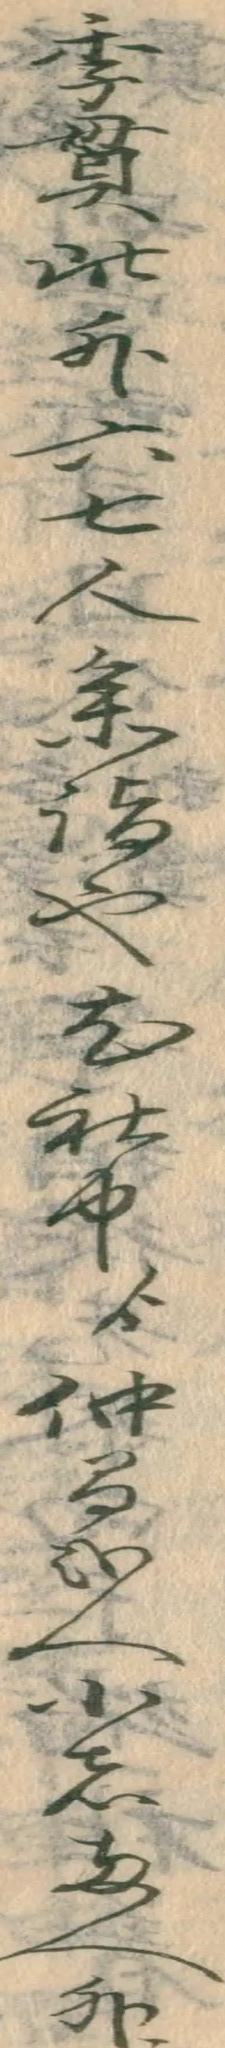季貫此外六七人参詣也尤社中ゟ仲間弐人小者両人外ニ
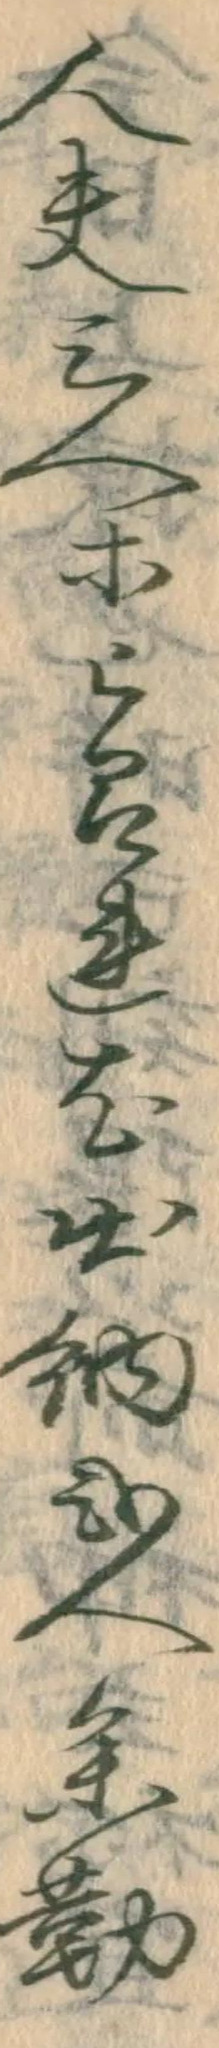人夫三人等被召連尤出納弐人参勤
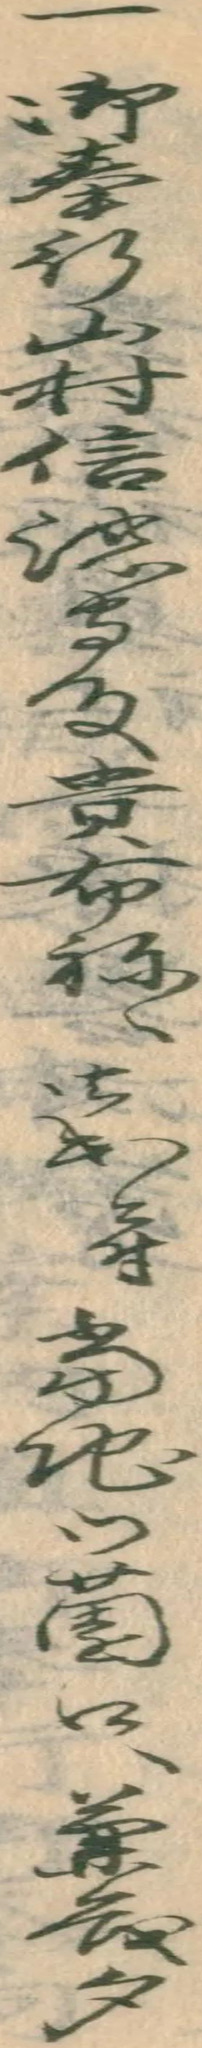一御奉行山村信濃守殿貴布祢へ御出ニ付当地御薗口へ兼茂夕
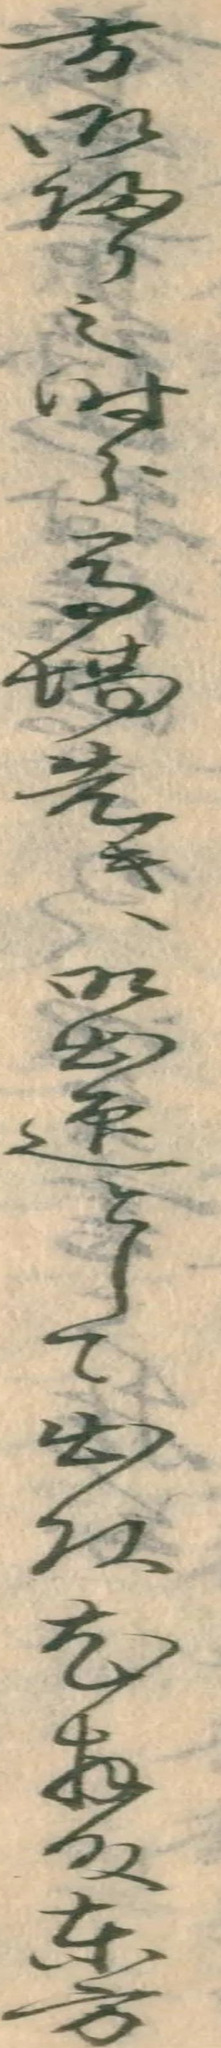方御帰り之時分馬場先キへ御出迎として出頭尤拝殿東方
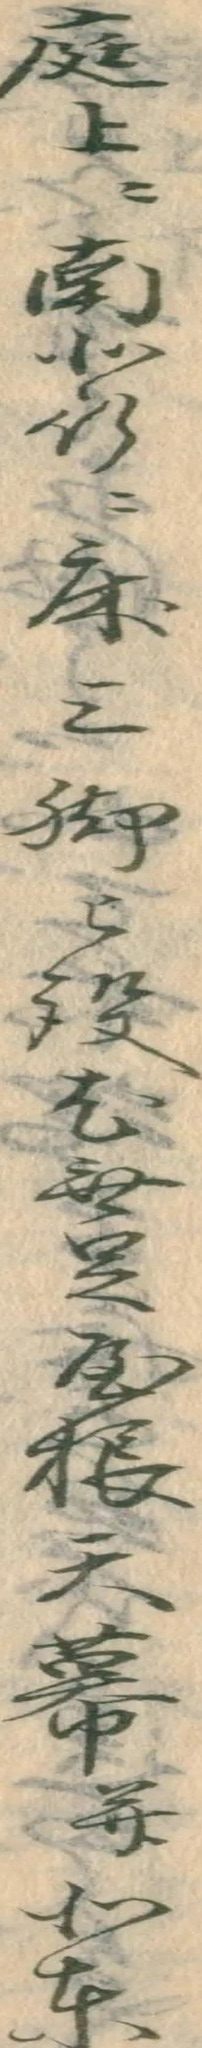庭上ニ南北行ニ床三脚被設尤無足屋根天幕并北東
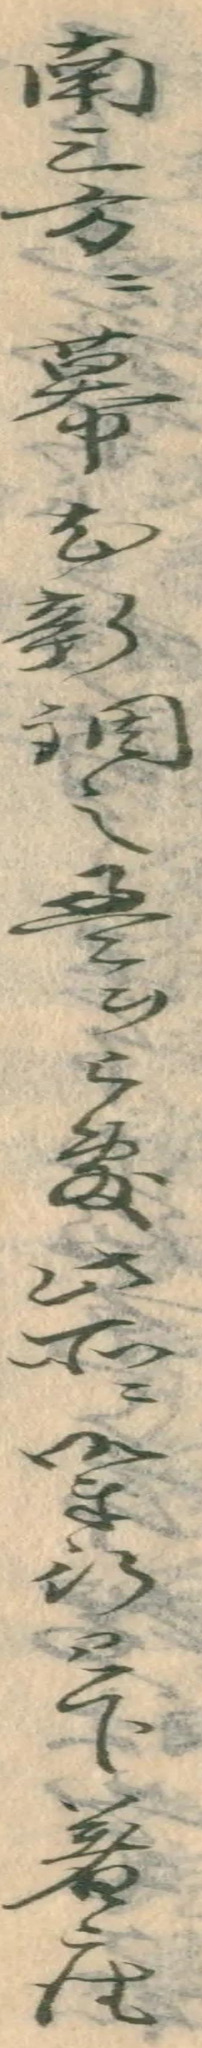南三方ニ幕尤新調之畳ヲ被敷此所ニ御奉行已下着座
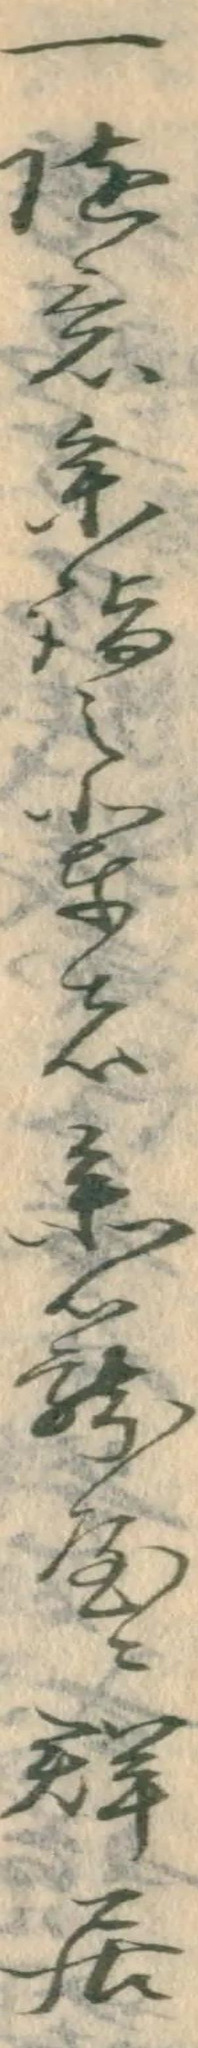一随意参詣之輩は参籠屋に群居
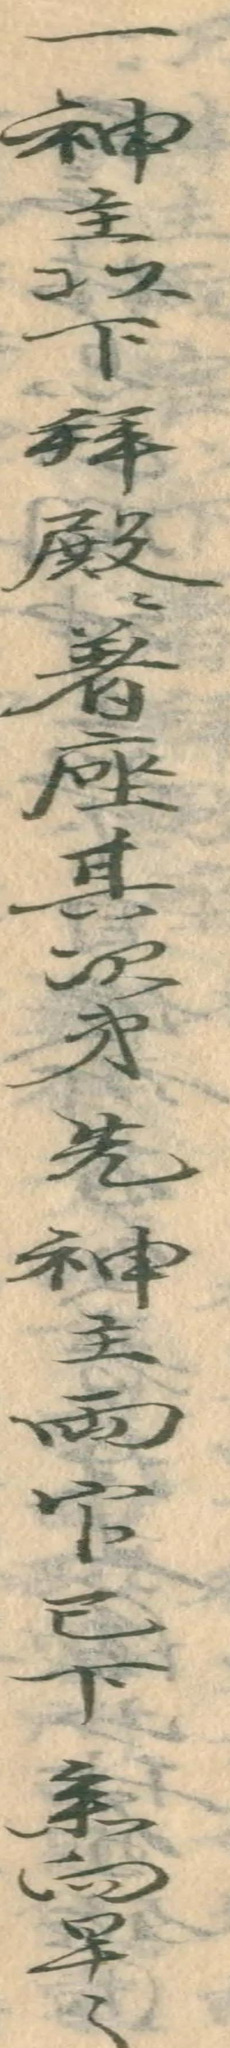一神主以下拝殿ニ着座其次第先神主両官已下参向早々
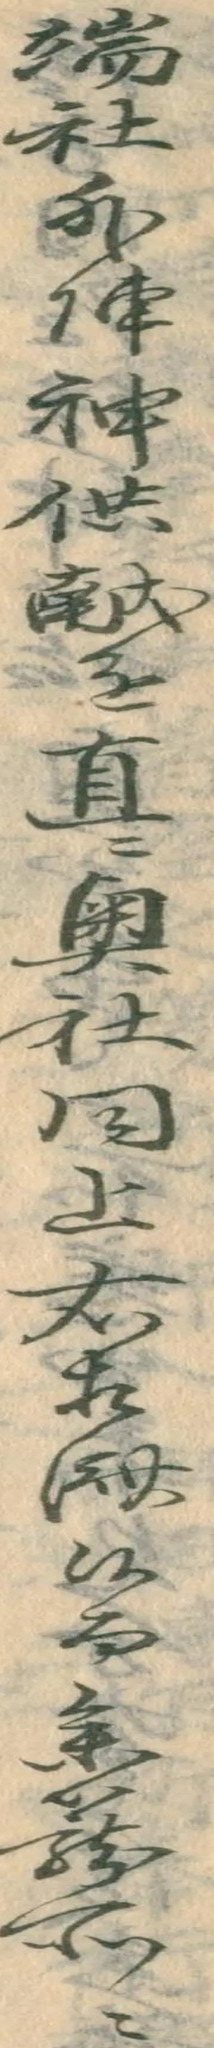端社外陣神供献進直ニ奥社同上右相済候而参籠所ニ
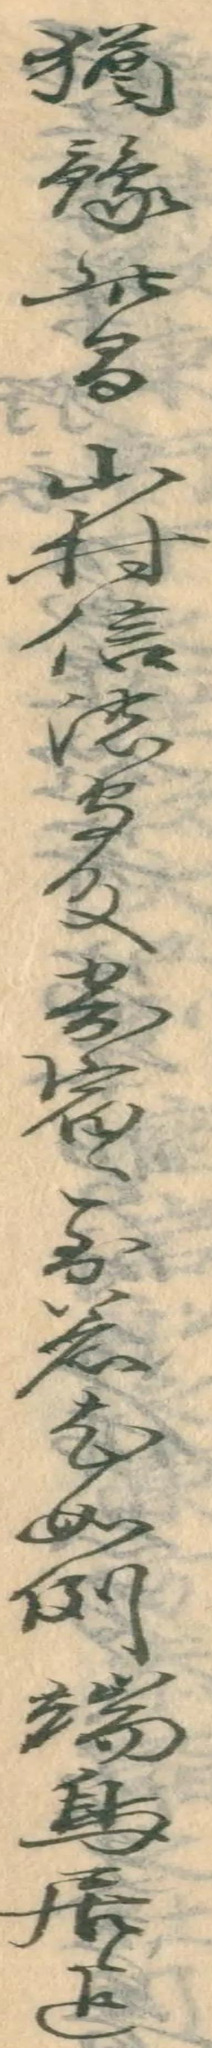猶予此間山村信濃守殿寄宿へ到着尤如例端鳥居迄

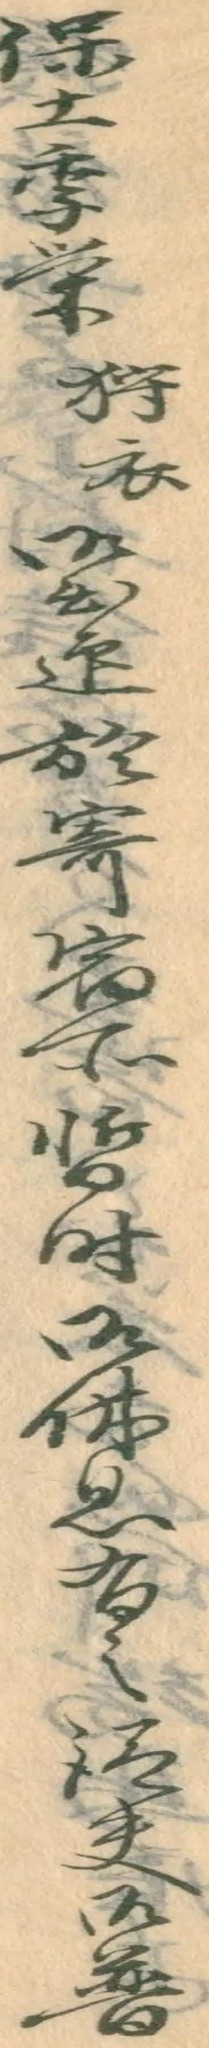保土季栄狩衣御出迎於寄宿所暫時御休息有之従夫御普
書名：賀茂社記録. 第17冊
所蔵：国立国会図書館 National Diet Library, JAPAN
